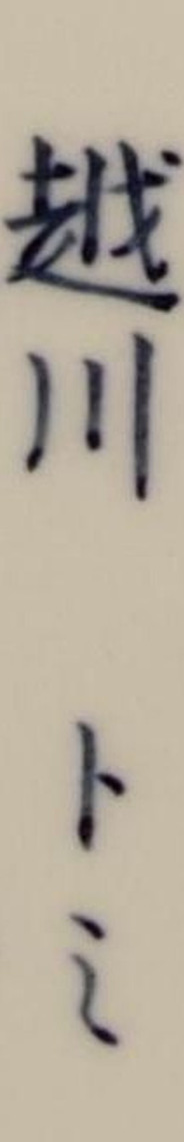越川トミ
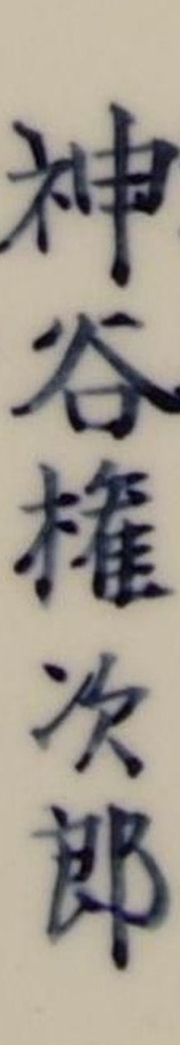神谷権次郎
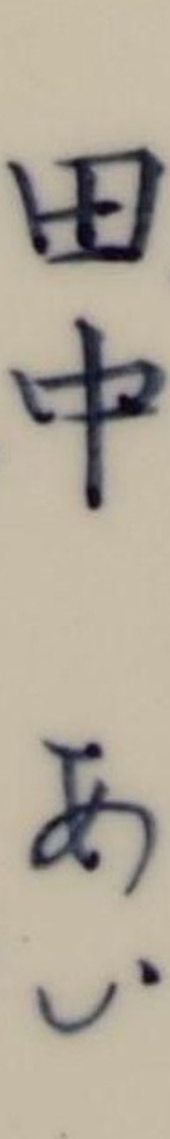田中あい
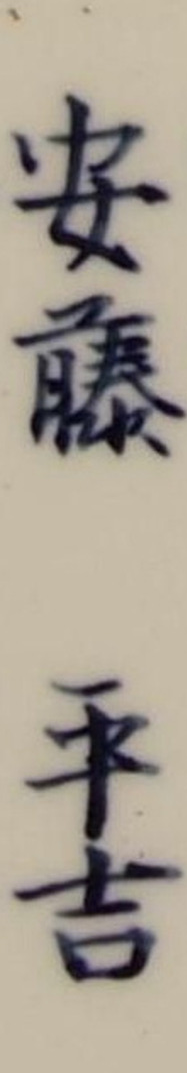安藤平吉
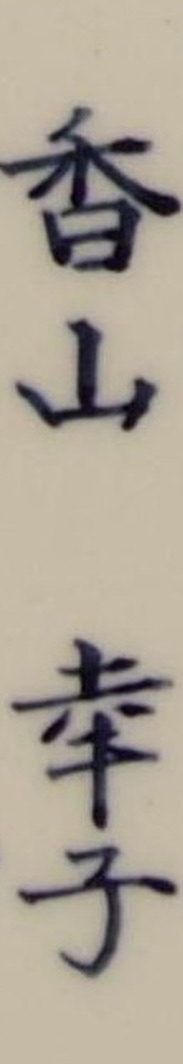香山幸子
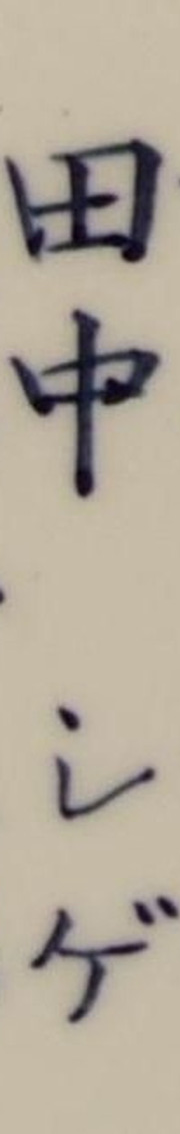田中シゲ
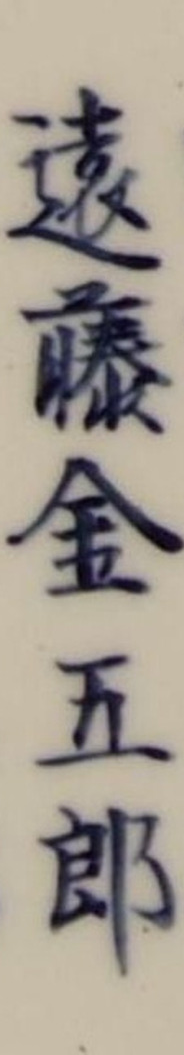遠藤金五郎
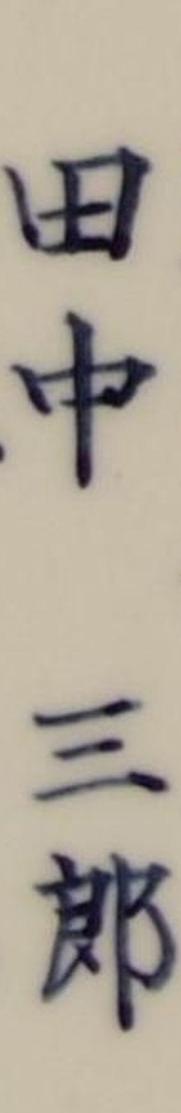田中三郎
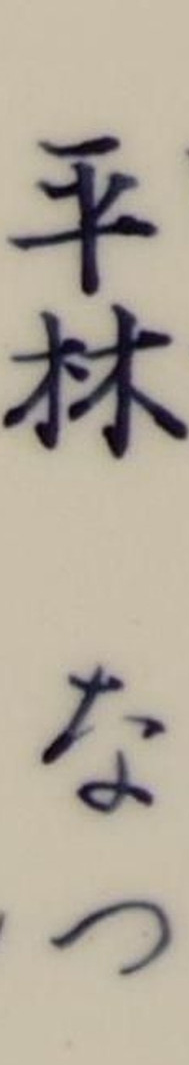平林なつ

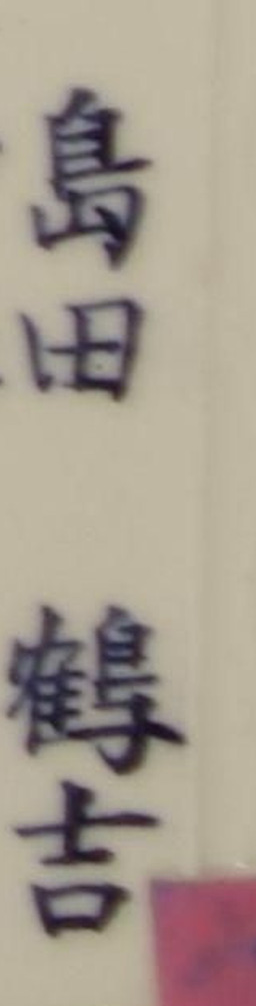島田鶴吉
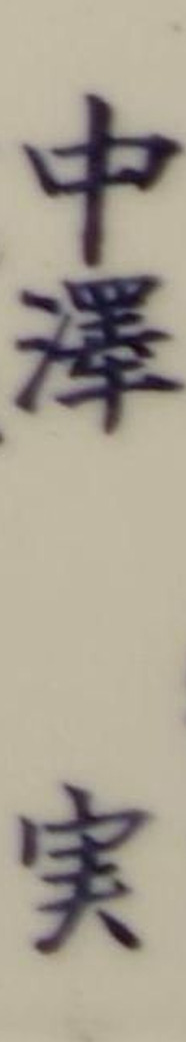中澤実
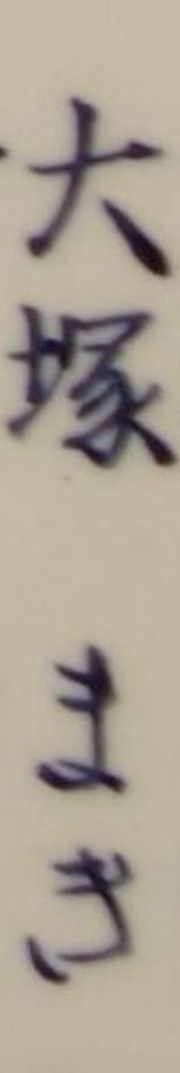大塚まき
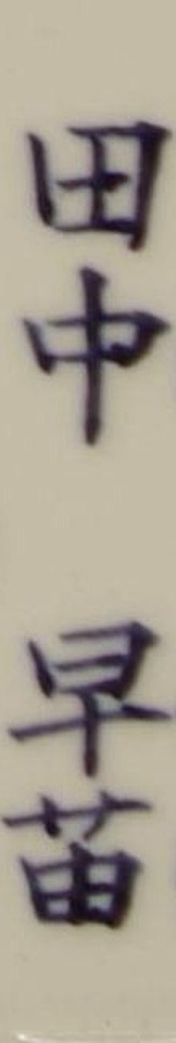田中早苗
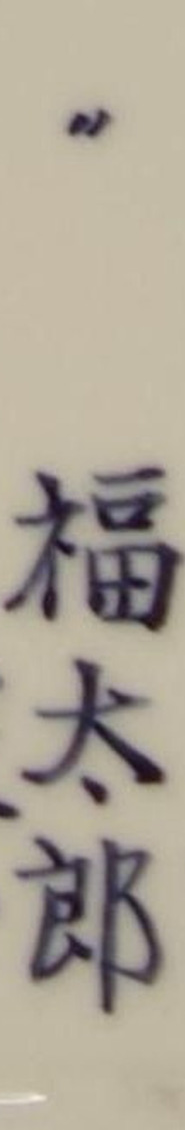福太郎
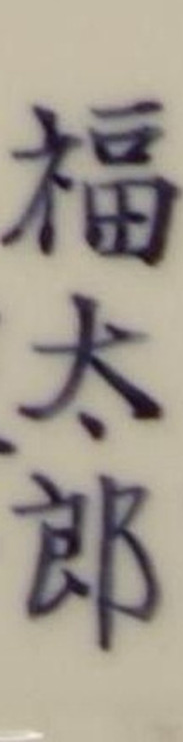福太郎
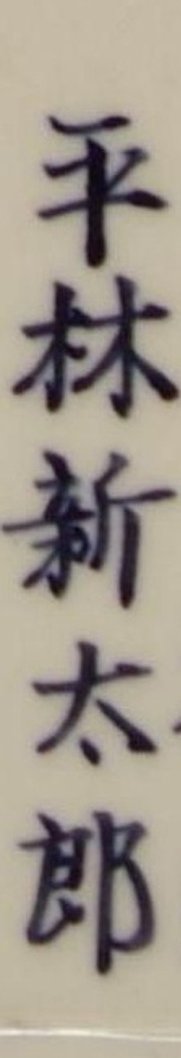平林新太郎
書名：E~L
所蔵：高野山金剛峯寺
